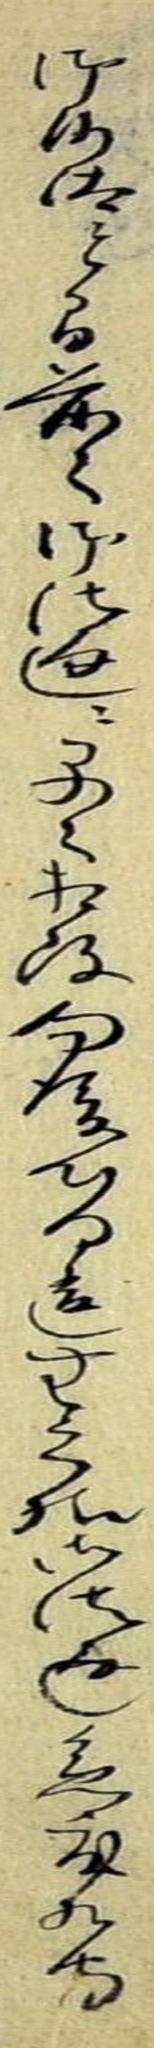御沙汰に候間前々御法通に早々相改向後心得違無之様御法通急度相守
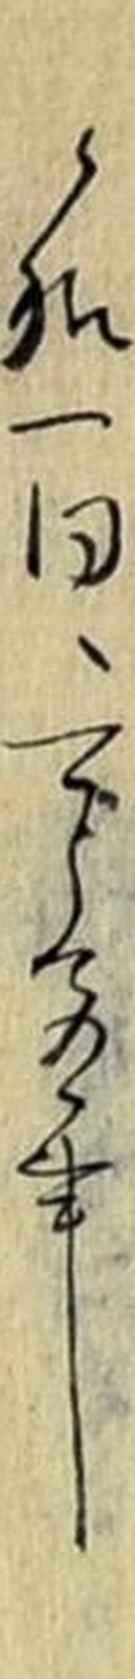候様一同へ可申聞事
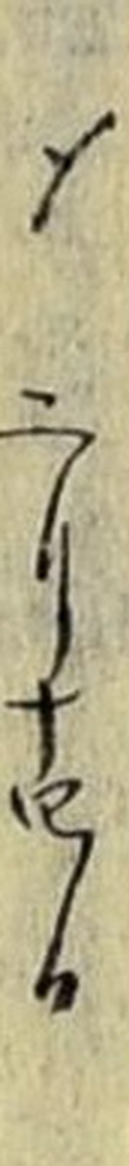〆二月十四日
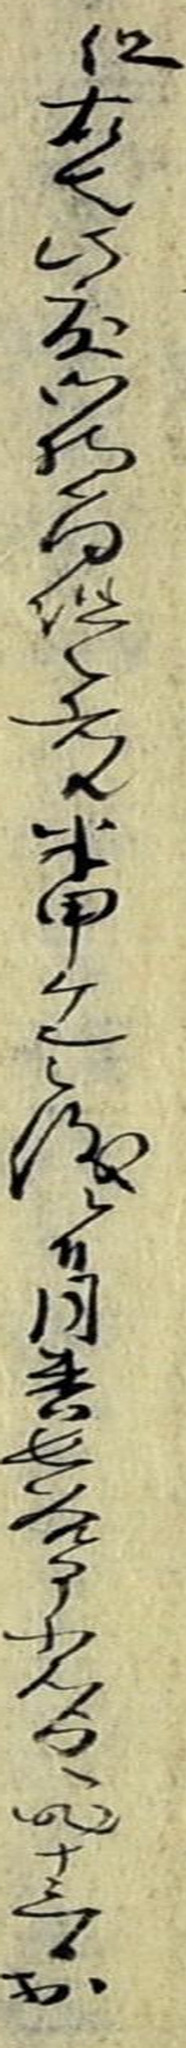但右は此度御持筒組之者共半甲ヶン之儀に付月番長谷部小右衛門へ昨十三日於
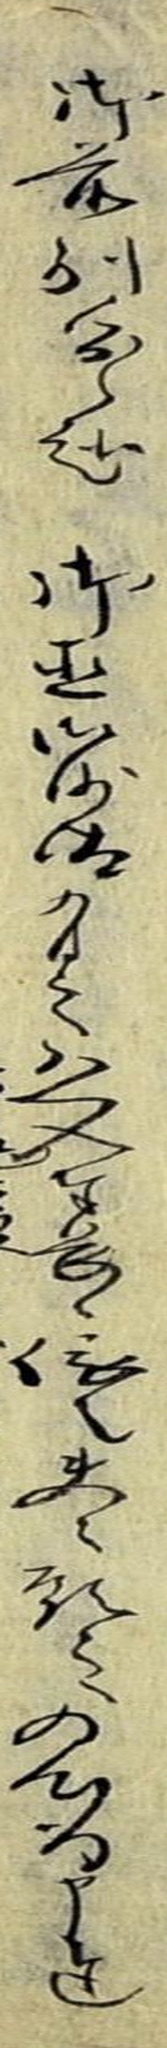御前別紙之趣御直御沙汰有之恐入奉畏候依之夫々頭々へ為心得申達
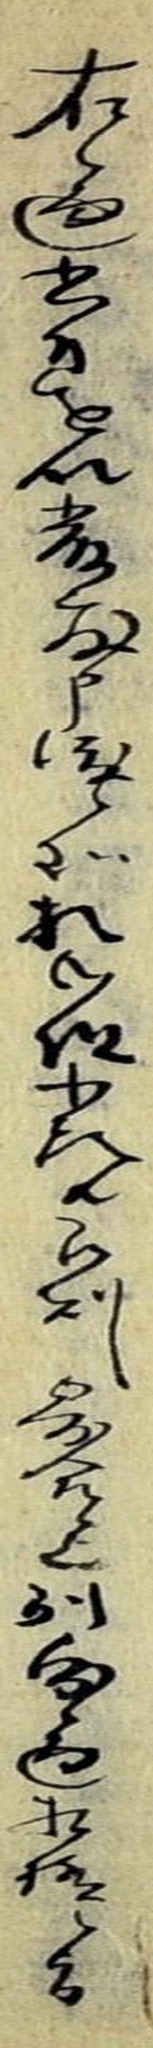右之通書付を以厳敷申渡候処拾弐組小頭共即刻寄合之上別紙之通相極候旨
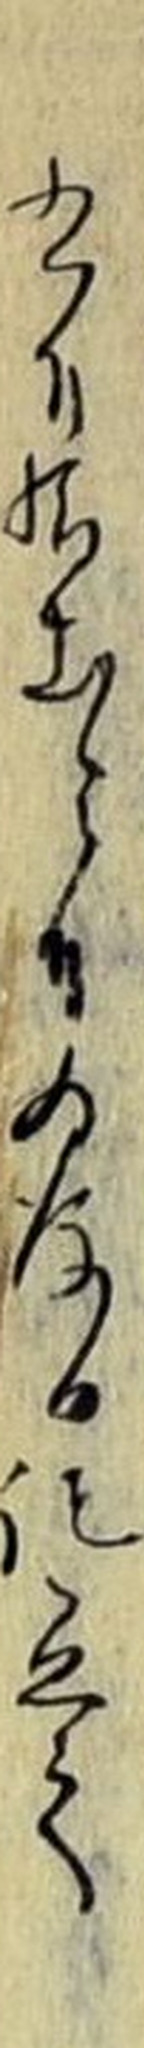書付指出候に付為後日記置之
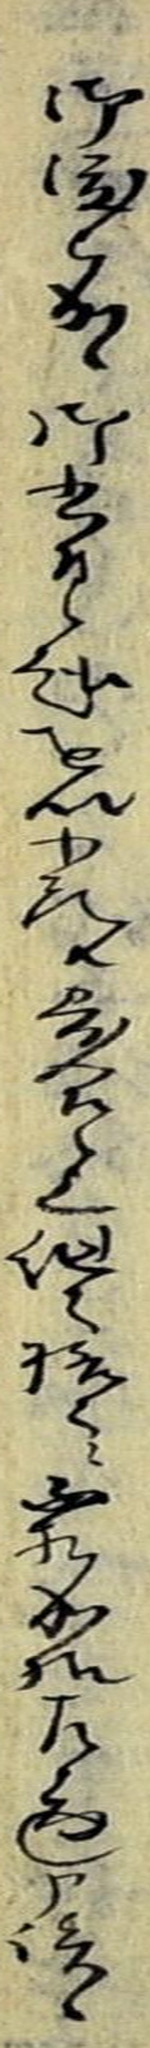御渡被成候御書付之趣を以小頭共寄合之上他之極に不相成様左之通申渡候
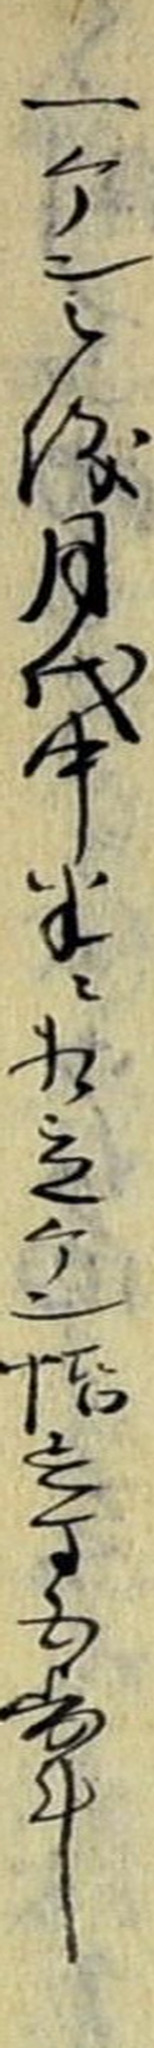一ケン之儀月代中半に相立ケン幅壱寸五歩斗
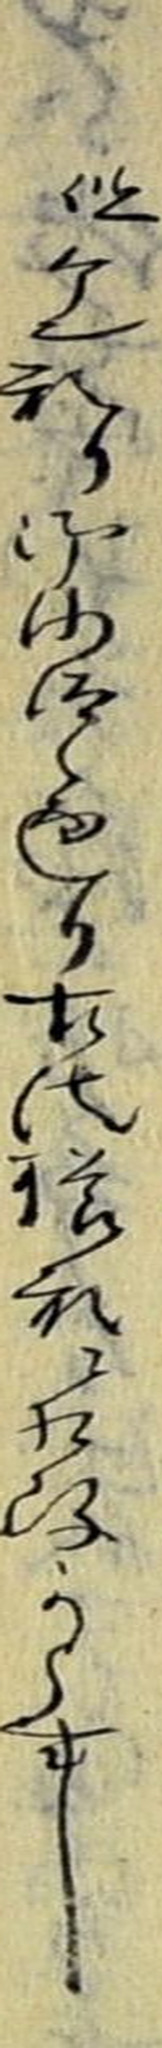但ケン形り御沙汰之通り古法櫛形に相改可申事
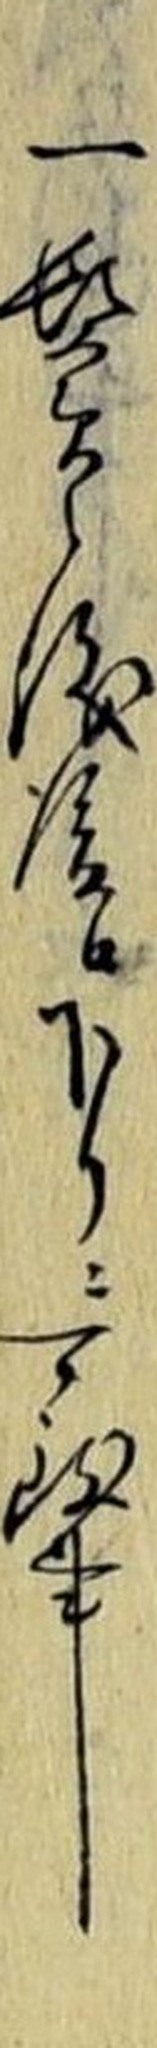一髷之儀後口下りに可致事
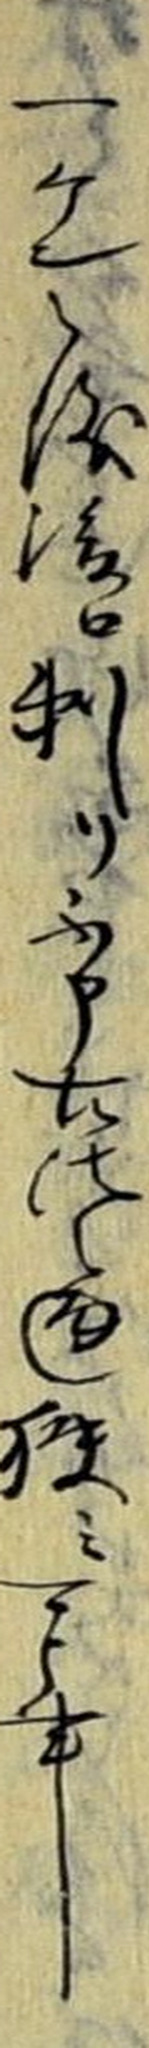一ケン之儀後口剃り不申古法之通狭ミ可申事
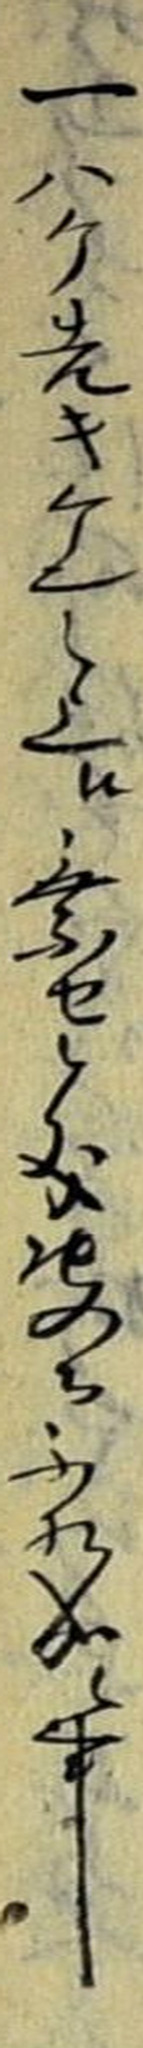一ハケ先キケン之上江乗セ候義決而不相成候事
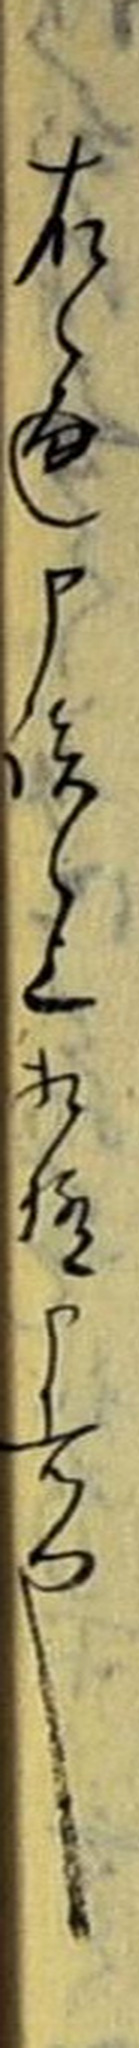右之通申談之上相極申者也
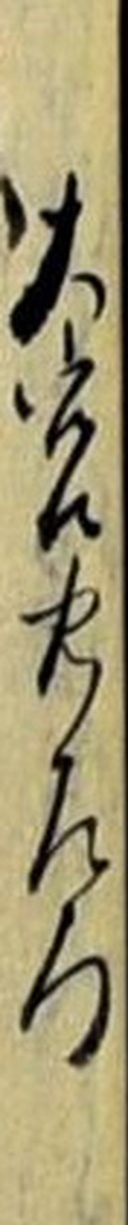大宮忠左衛門
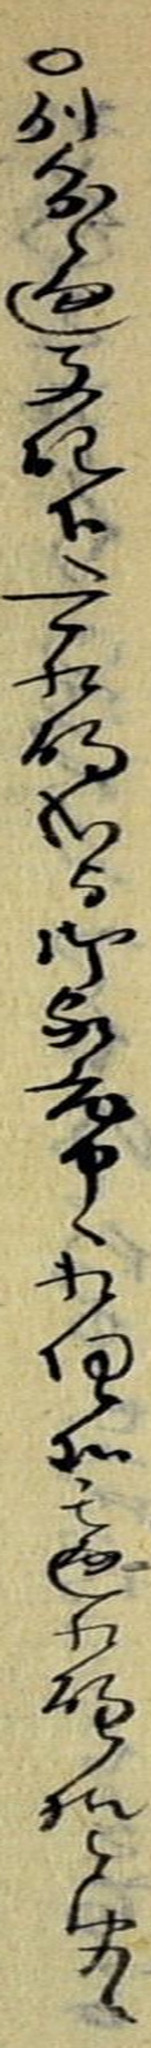○別紙之通支配下へ可相触哉と御家老中へ相伺候処其通相触候様被申聞候
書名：命令之部 四
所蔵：福井県文書館 Fukui Prefectural Archives
